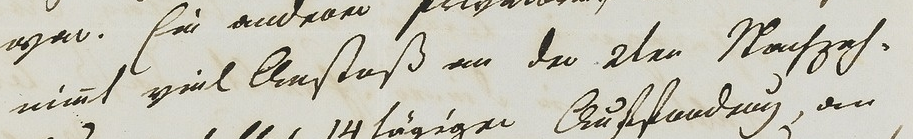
nimmt viel Anstoß an der 2ten Nachzah-
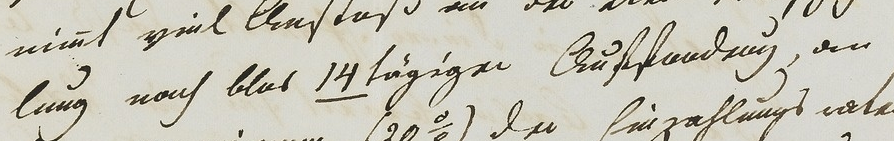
lung nach blos 14tägiger Aufforderung, an
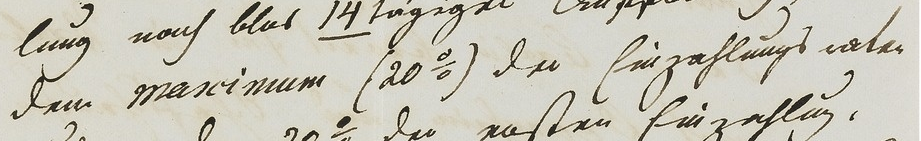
dem Maximum (20%) der Einzahlungsraten
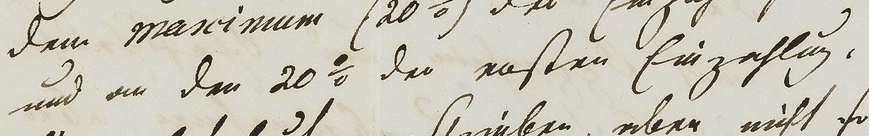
und an den 20% der ersten Einzahlung.
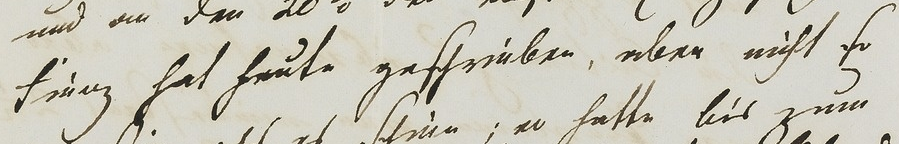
Fierz hat heute geschrieben, aber nicht so
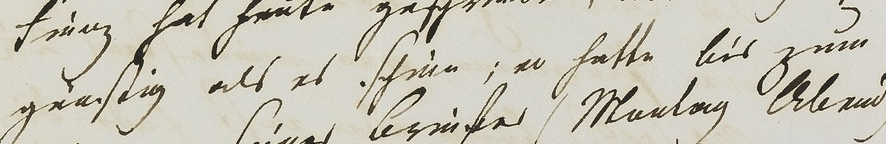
günstig als es schien; er hatte bis zum
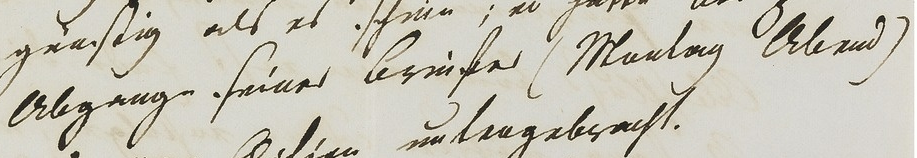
Abgange seiner Briefe (Montag Abend)
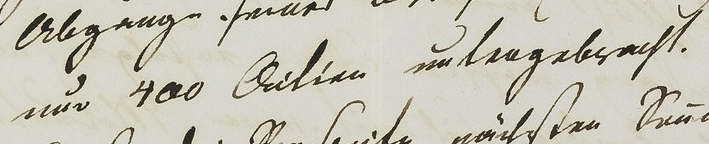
nur 400 Actien untergebracht.
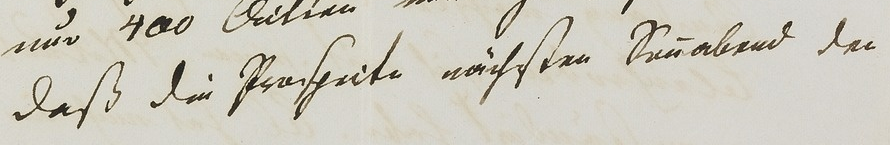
Daß die Prospecte nächsten Sonnabend den
